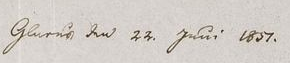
Glarus den 22. Juni 1851.
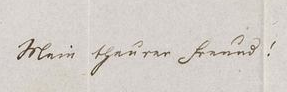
Mein theurer Freund!
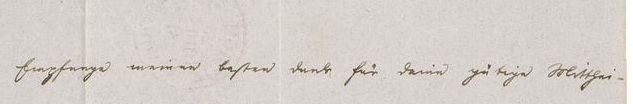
Empfange meinen besten Dank für Deine gütige Mitthei-
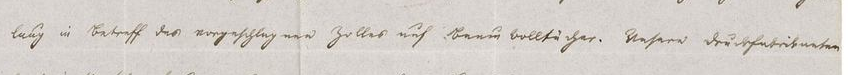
lung in Betreff des vorgeschlagnen Zolles auf Baumwolltücher. Unsere Druckfabrikanten
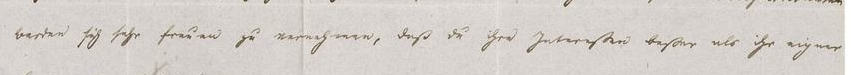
werden sich sehr freuen zu vernehmen, daß Du ihre Interessen besser als ihr eigner
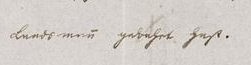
Landsmann gewahrt hast.
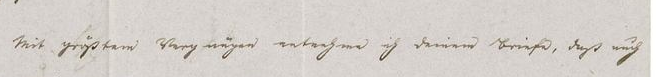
Mit größtem Vergnügen entnehme ich Deinem Briefe, daß auch
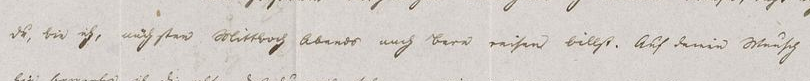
Du, wie ich, nächsten Mittwoch Abends nach Bern reisen willst. Auf Deinen Wunsch
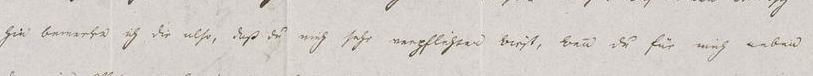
hin bemerke ich Dir also, daß Du mich sehr verpflichten wirst, wenn Du für mich neben
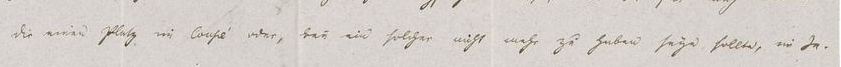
Dir einen Platz im Coupé oder, wenn ein solches nicht mehr zu haben seyn sollte, im In-
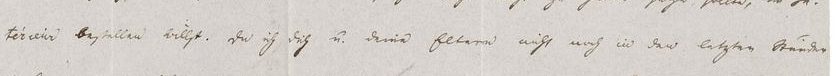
térieur bestellen willst. Da ich Dich u. Deine Eltern nicht noch in den letzten Stunden
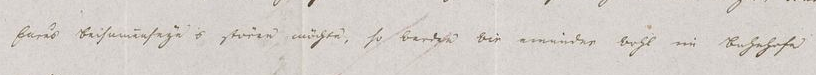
Eures Beisammenseyn's stören möchte, so werden wir einander wohl im Bahnhofe
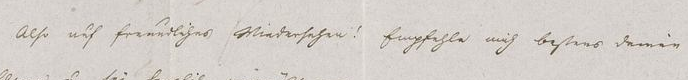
Also auf freundliches Wiedersehen! Empfehle mich bestensDeinen
